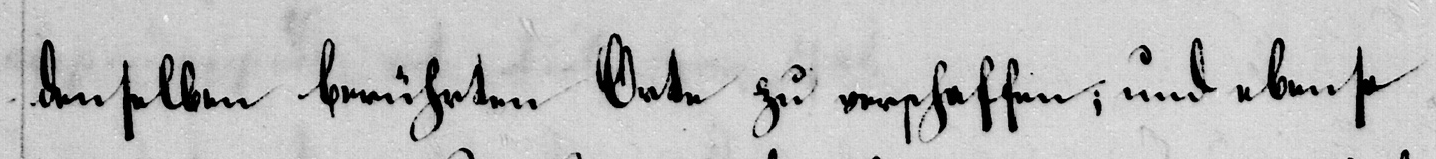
denselben berührten Orte zu verschaffen; und ebenso
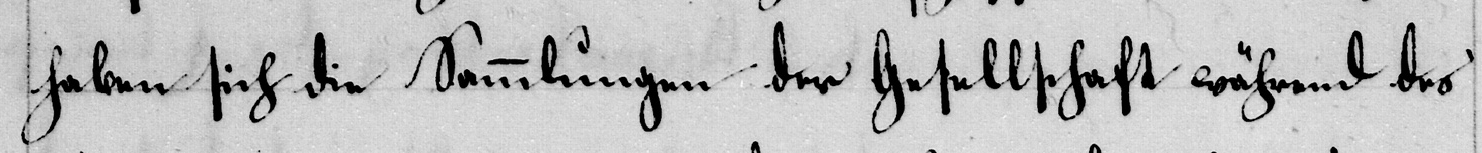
haben sich die Sammlungen der Gesellschaft während des
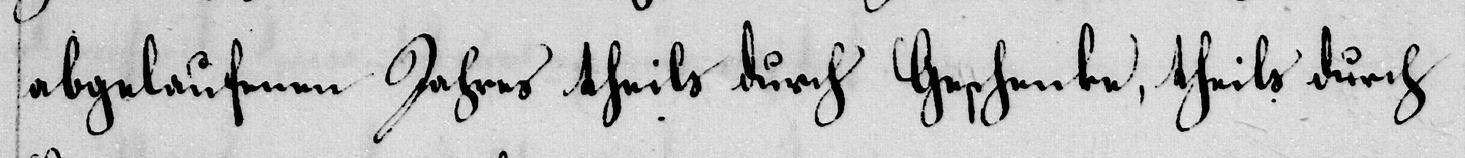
abgelaufenen Jahres theils durch Geschenke, theils durch
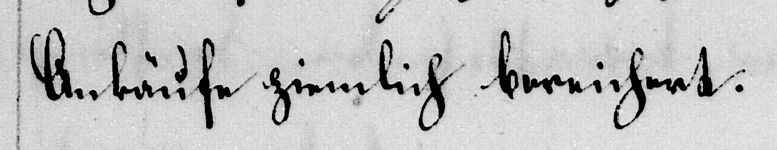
Ankäufe ziemlich bereichert.
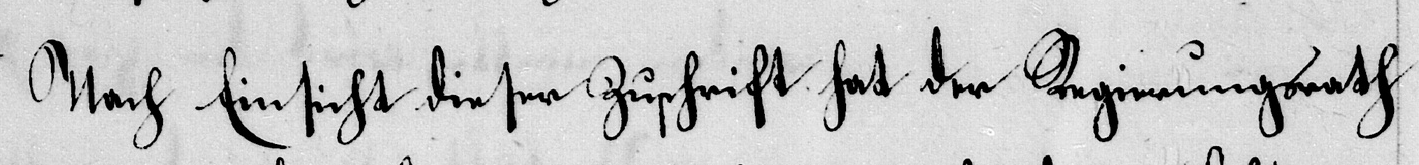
Nach Einsicht dieser Zuschrift hat der Regierungsrath
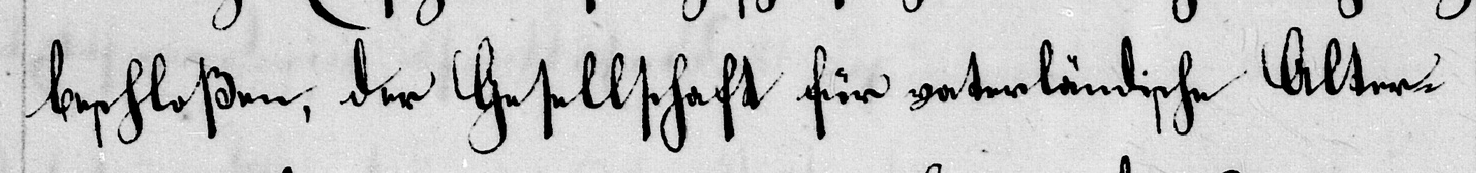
beschloßen, der Gesellschaft für vaterländische Alter¬
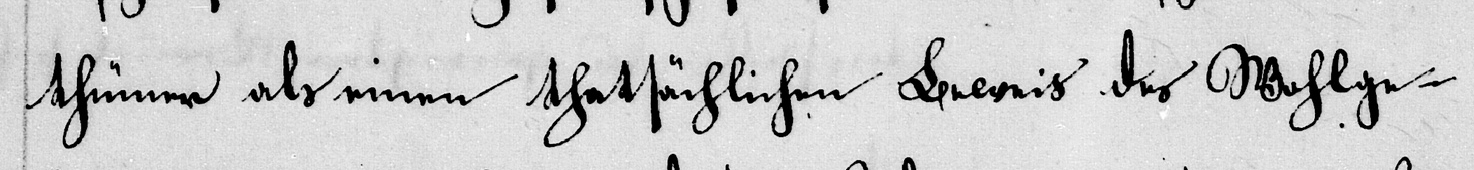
thümer als einen thatsächlichen Beweis des Wohlge¬
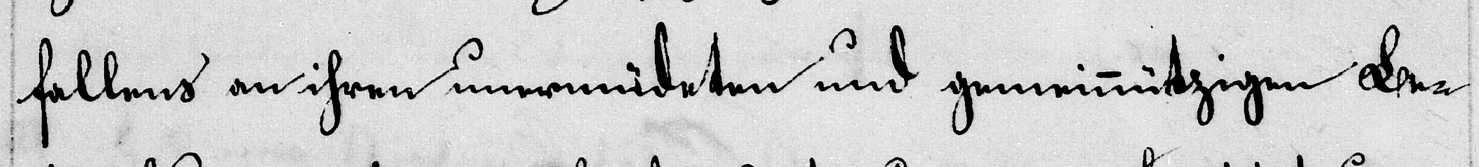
fallens an ihren unermüdeten und gemeinnützigen Be¬
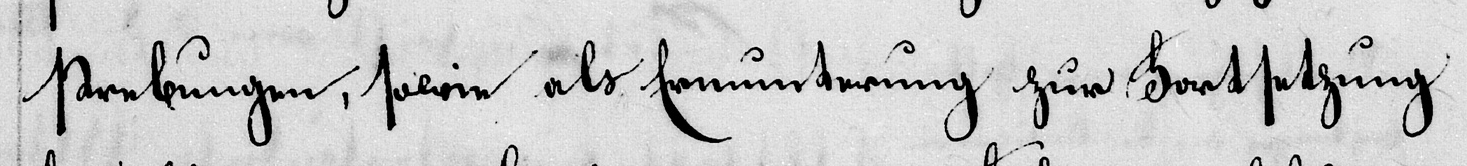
strebungen, sowie als Ermunterung zur Fortsetzung
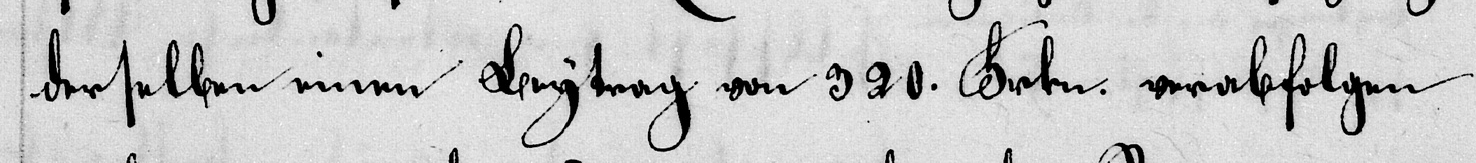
derselben einen Beytrag von 320. Frk[en] verabfolgen
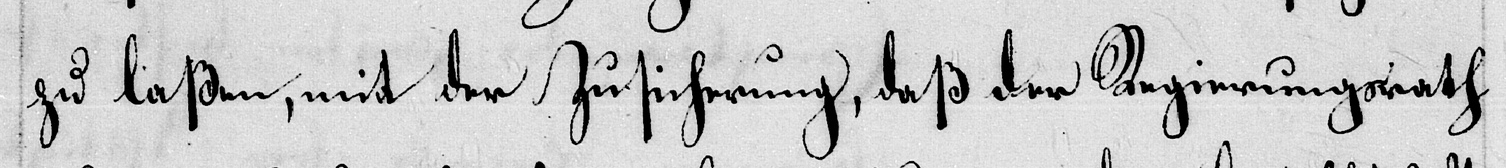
zu laßen, mit der Zusicherung, daß der Regierungsrath
